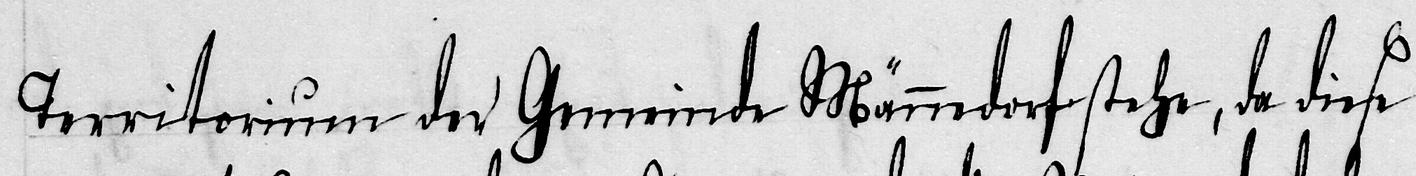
Territorium der Gemeinde Männedorf stehe, da diese
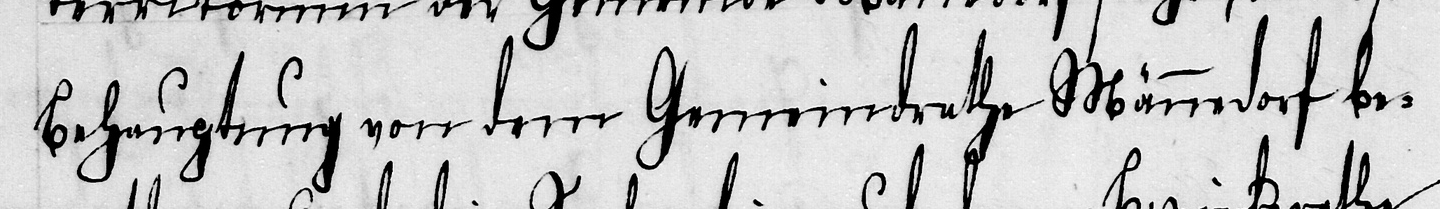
Behauptung von dem Gemeindrathe Männedorf be¬
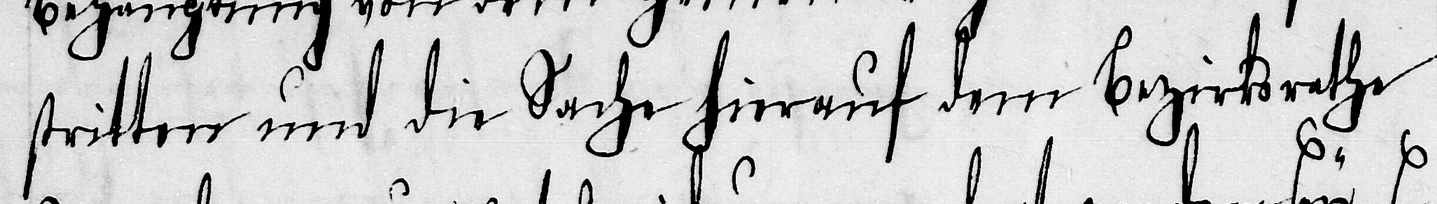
stritten und die Sache hierauf dem Bezirksrathe
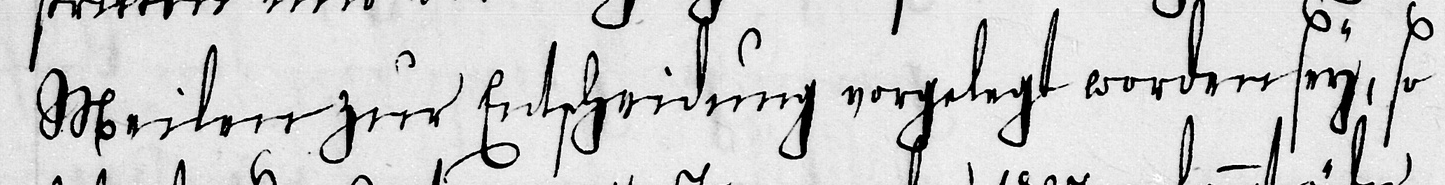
Meilen zur Entscheidung vorgelegt worden sey, so
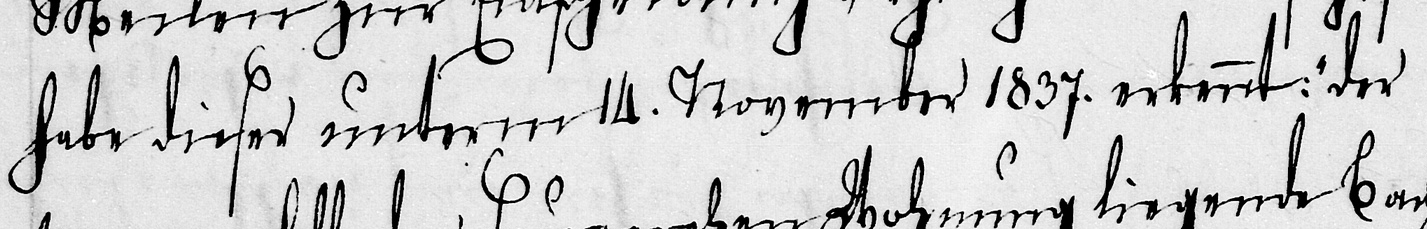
habe dieser unterm 14. November 1837. erkennt: „der
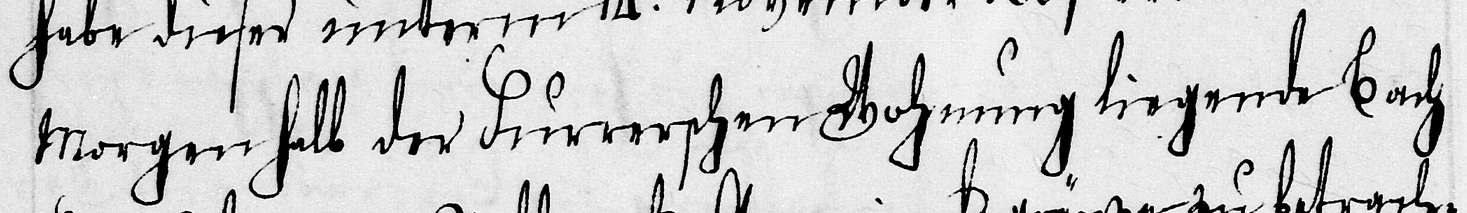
Morgen halb der Furrerschen Wohnung liegende Bach
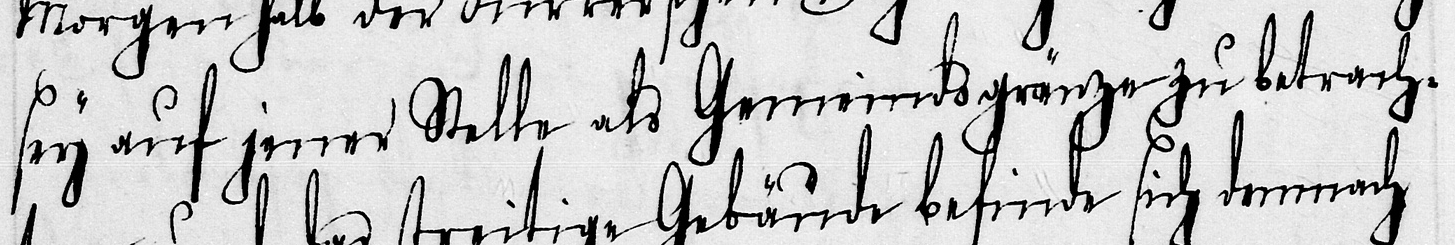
sey auf jener Stelle als Gemeindsgränze zu betrach¬
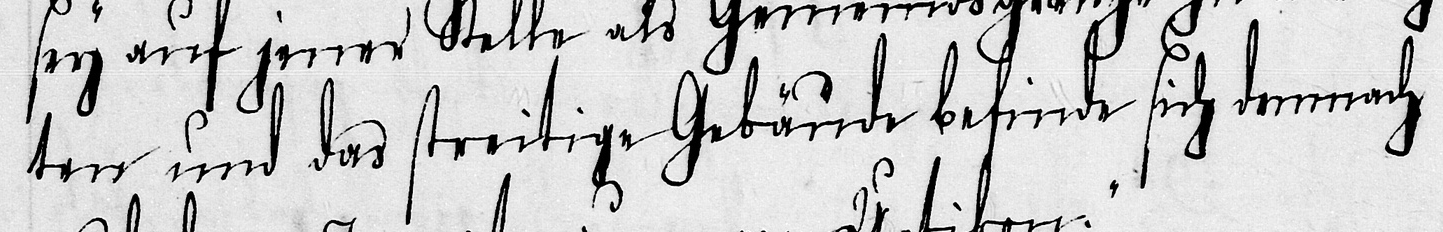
ten und das streitige Gebäude befinde sich demnach
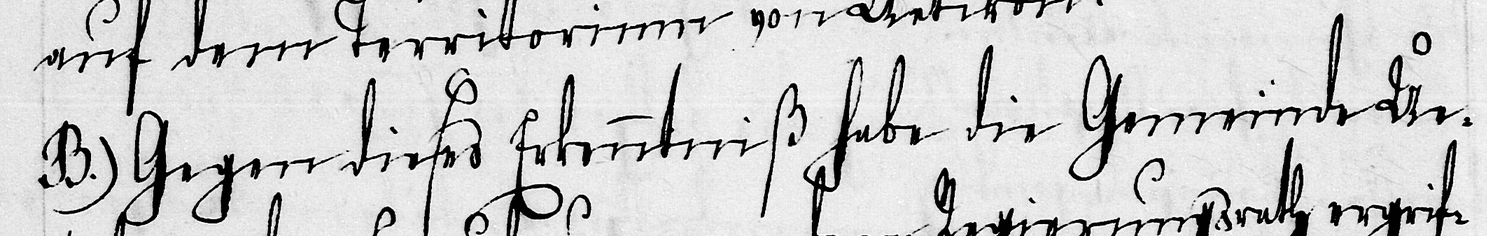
B.) Gegen dieses Erkenntniß habe die Gemeinde Ue¬
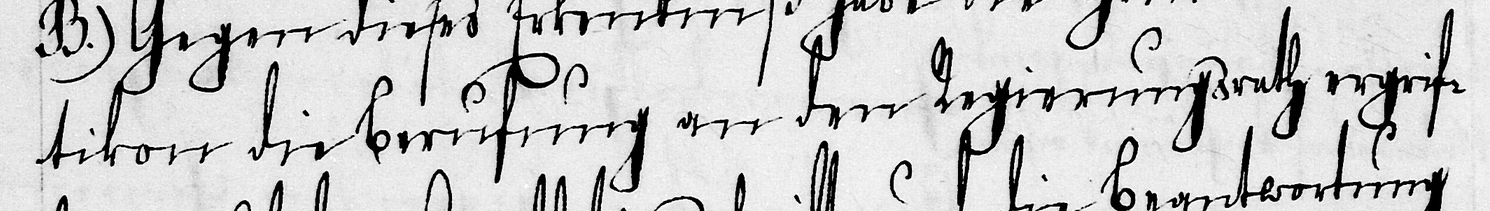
tikon die Berufung an den Regierungsrath ergrif¬
